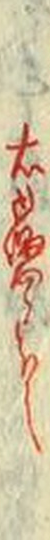右御側向へ被下
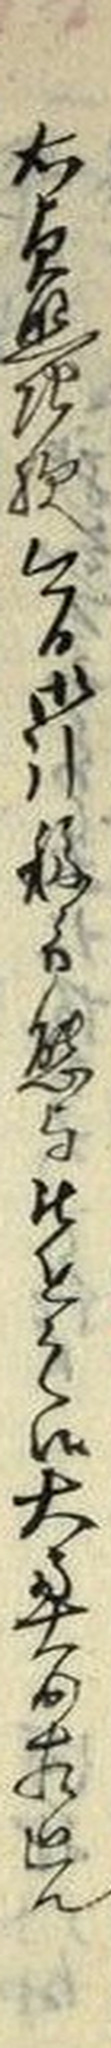右貞照院様今日御引移ニ付態与被進之候大奥ゟ相廻ル
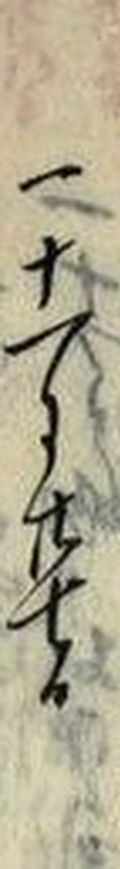一十一月廿七日
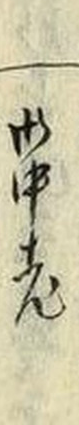御中老
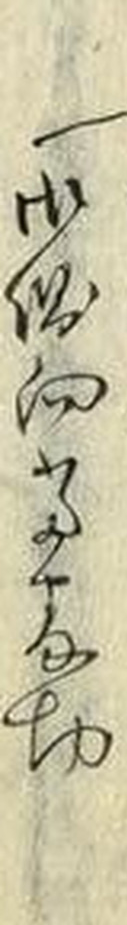御側向当番切
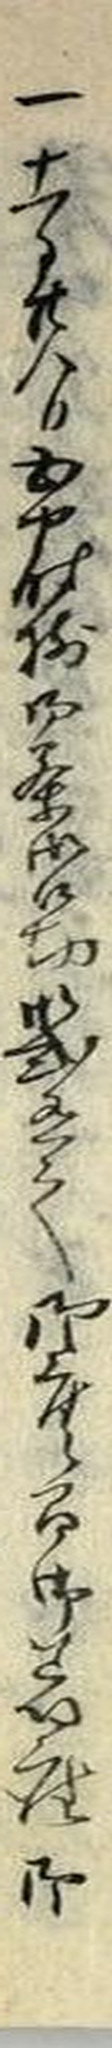一十一月廿八日五半時揃御茶御口切御式有之御座之間御着座御
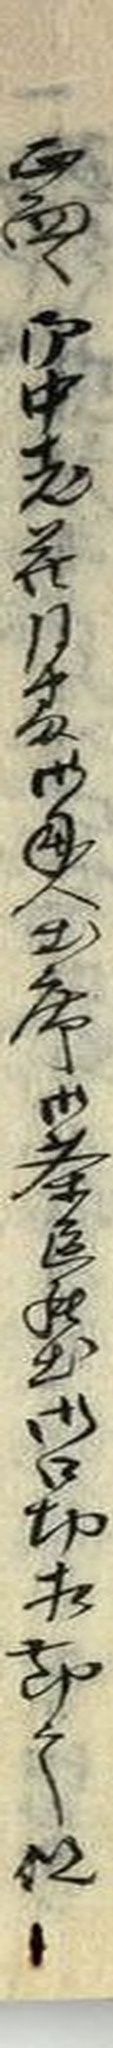正面へ御中老幷月番御用人出席御茶道罷出御口切相勤之但
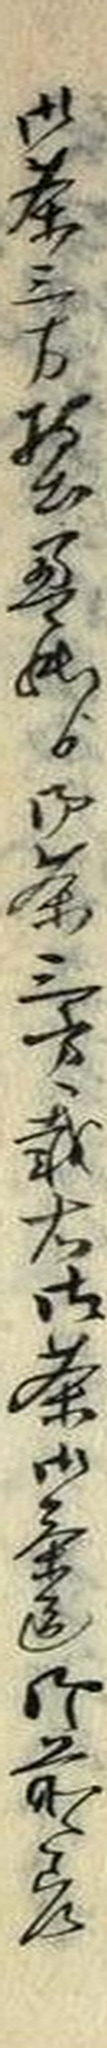御茶三方持出ゟ御茶三方へ載右御茶御茶道御前へ差
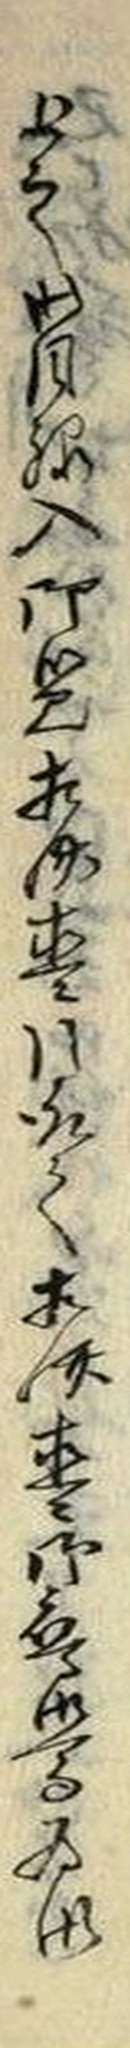上之御目録入御覧相済直ニ引取之相済直ニ御鷹御馬為御

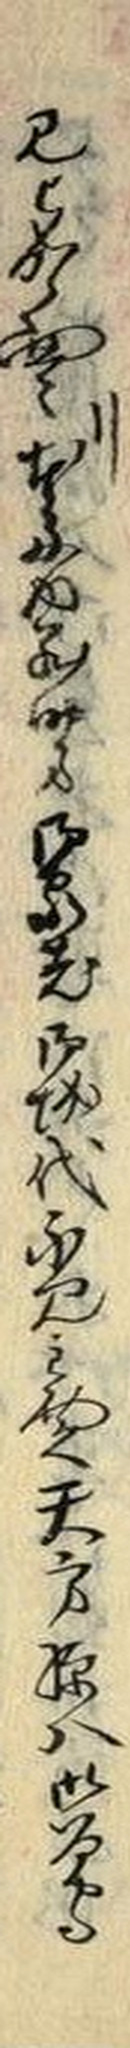見被成候面々本多内蔵助方御家老御城代永見主殿天方孫八御留守
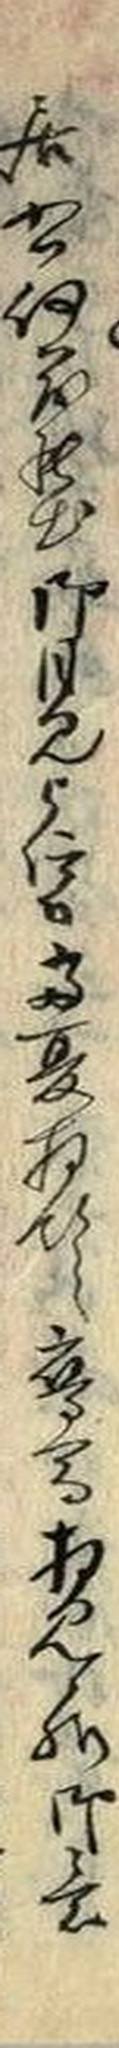居右何茂罷出御目見被仰付当夏拝領之鷹馬拝見候様御意
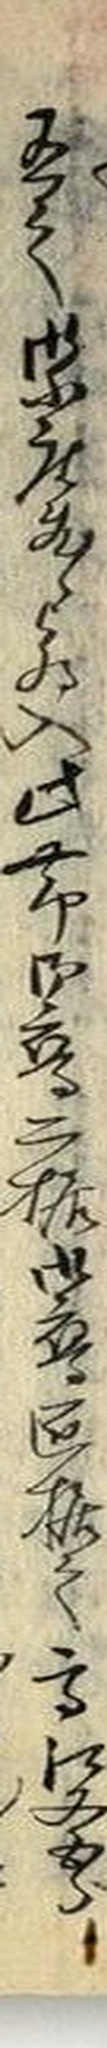有之御小座敷へ被為入此節御鷹二据御鷹匠据之高江又五郎
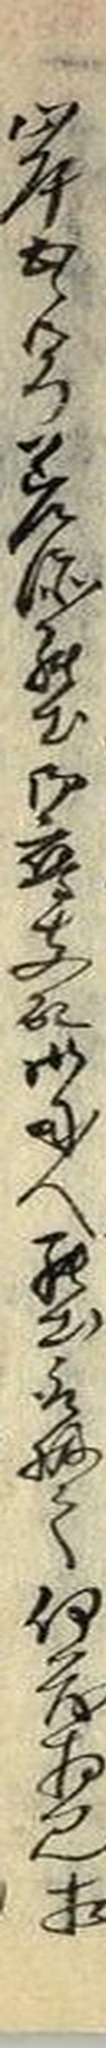岸五郎左衛門差添罷出御鷹支配御用人罷出取扱之何茂拝見相
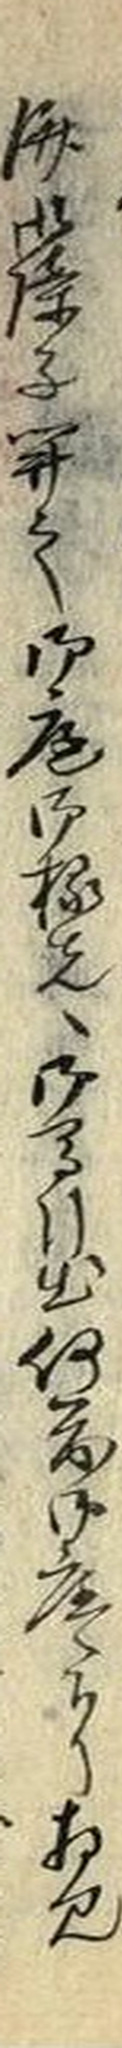済御障子開之御庭御縁先へ御馬引出何茂御庭へ下り拝見
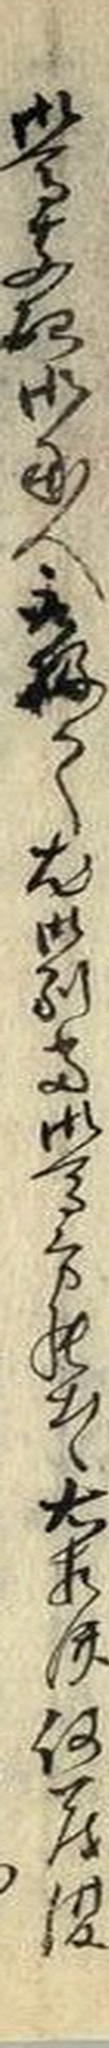御馬支配御用人取扱之尤御別当御馬方罷出候右相済何茂復
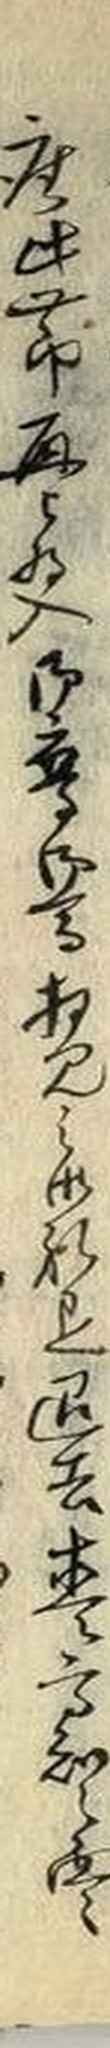座此節再被為入御鷹御馬拝見之御礼申上退去直ニ高知之面々
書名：少傅日録抄（斉承付側向頭取日記、在国）
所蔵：福井県文書館 Fukui Prefectural Archives
